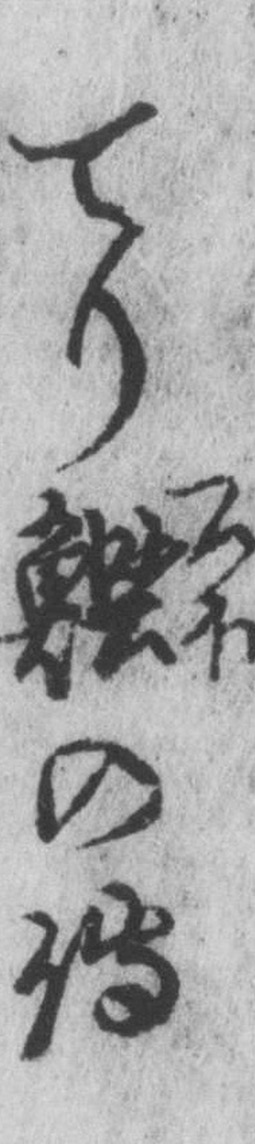てり鰹の傳
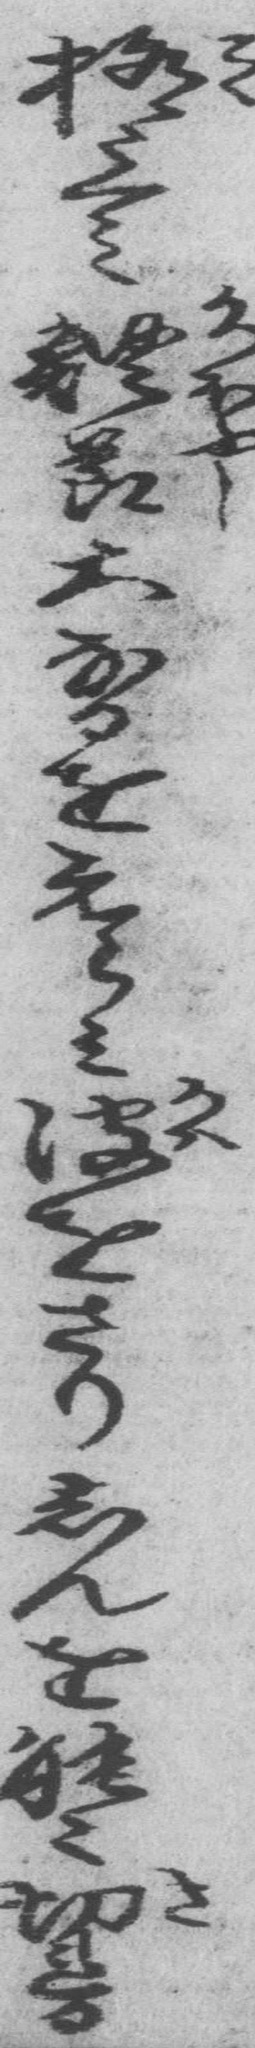極鰹節ななるをえらミ皮をさりしんを能々切れ
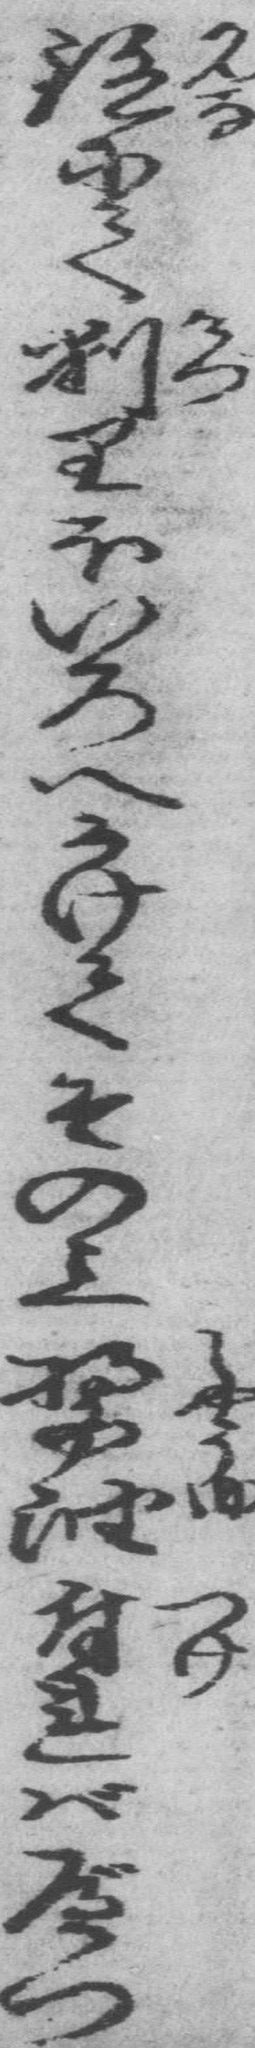鉋にて削りほいろにかけてその上醤油付れバべつ

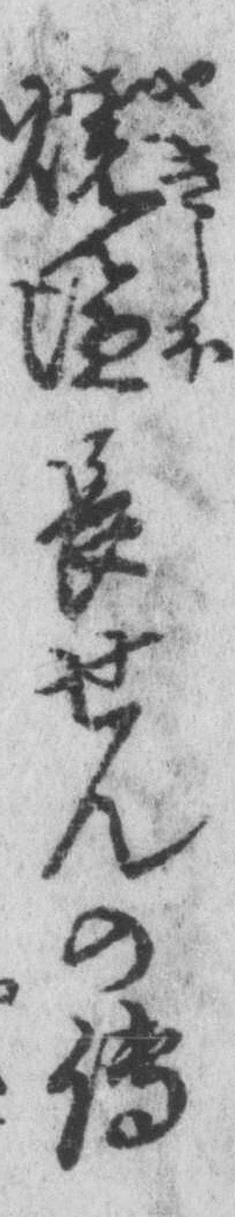焼塩長せんの傳
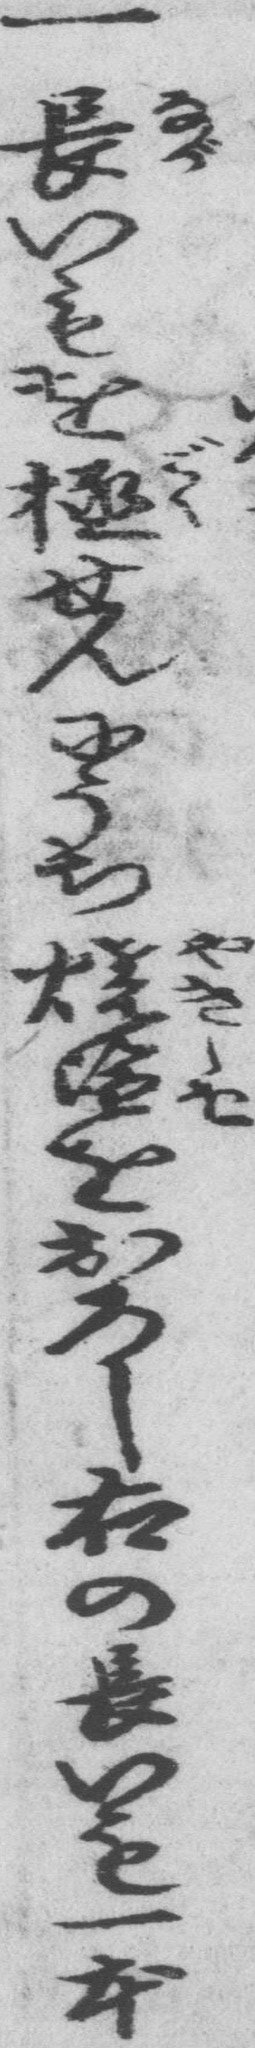一長いもを極せんにうち焼塩をおろし右の長いもを一本
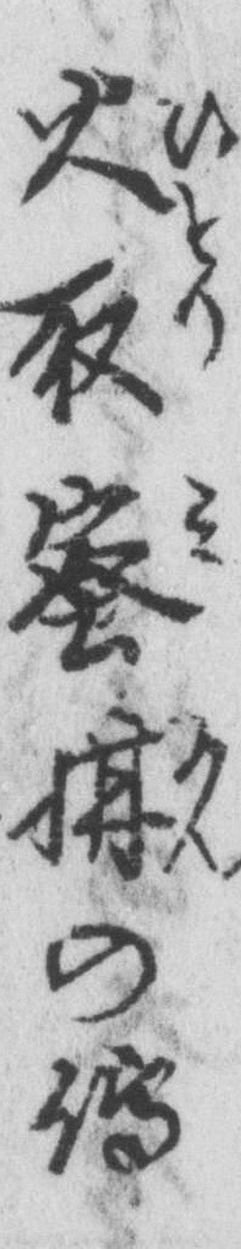火取蜜柑の傳
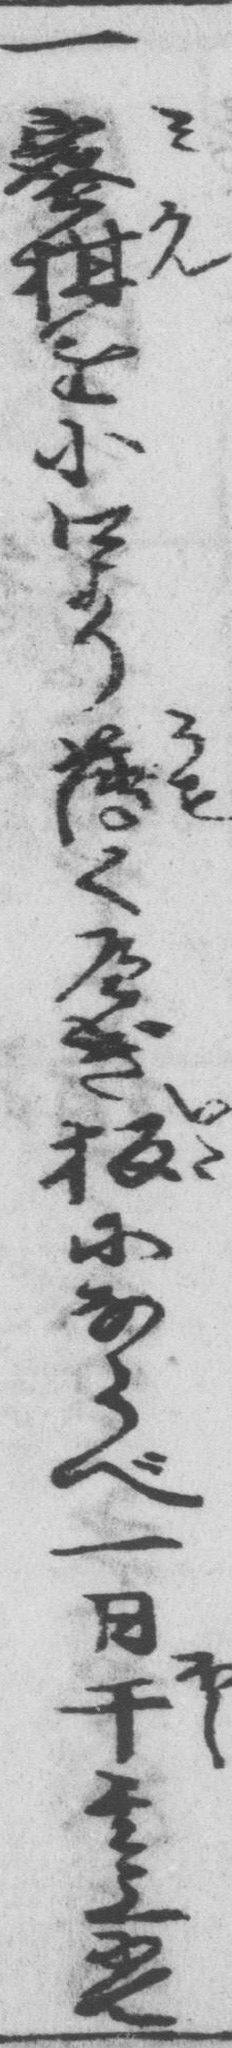一蜜柑を小口より薄くへぎ板にならべ一日干其上にて
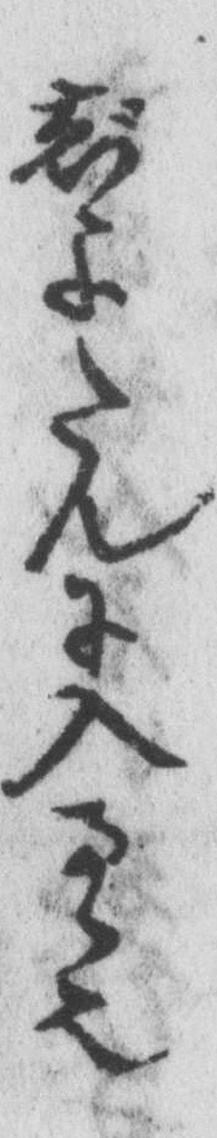じよたんに入る也
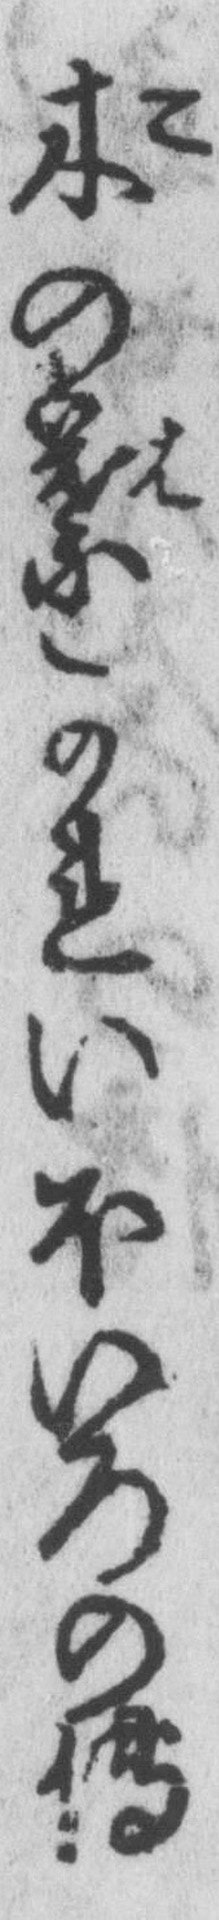木の葉かれいほいろの傳
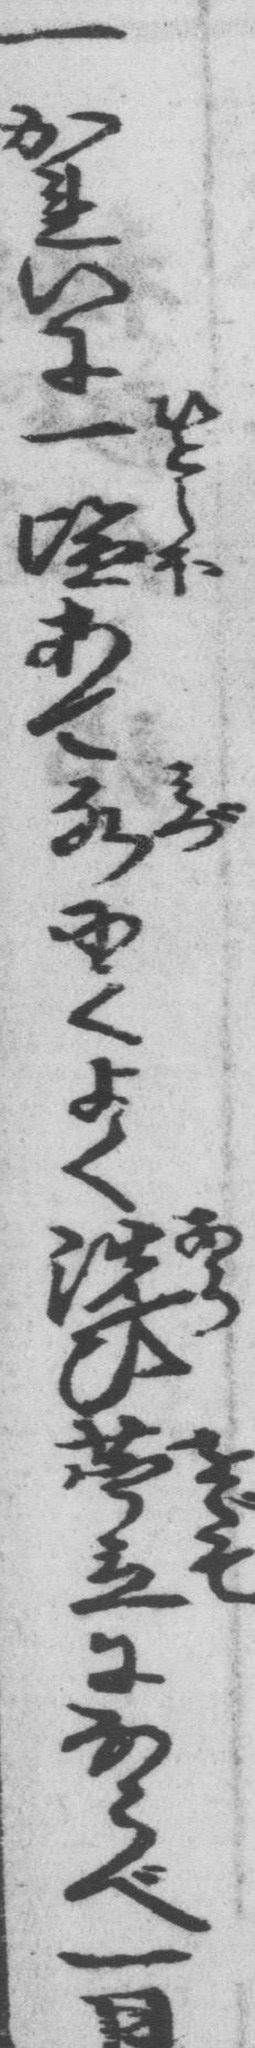一かれい一塩あて水にてよく洗ひ帯立にならべ一日
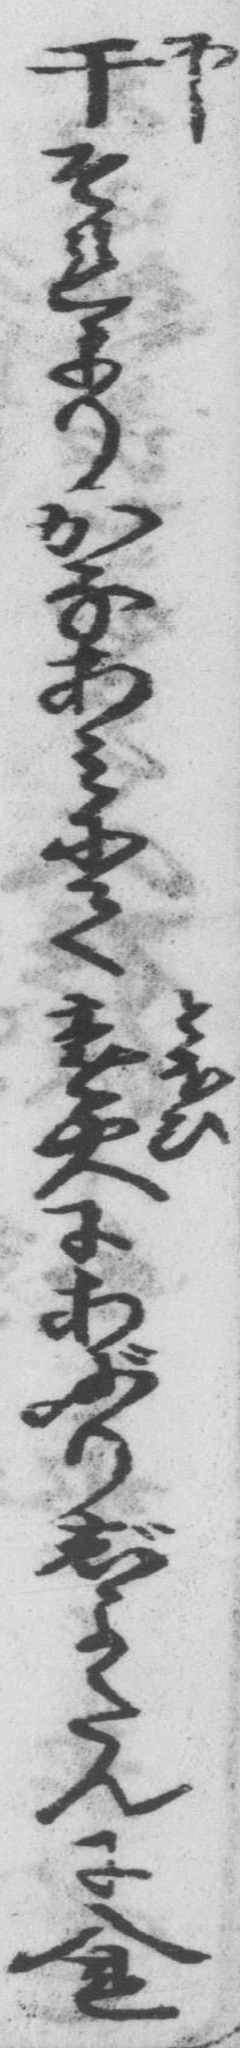干それよりかなあミにて遠火にあぶりじよたんに入れ
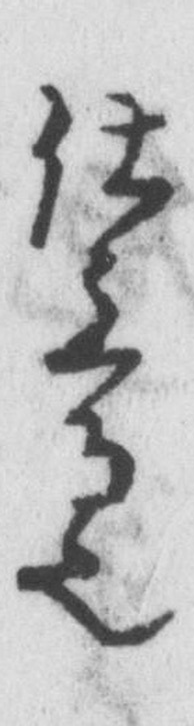仕立る也
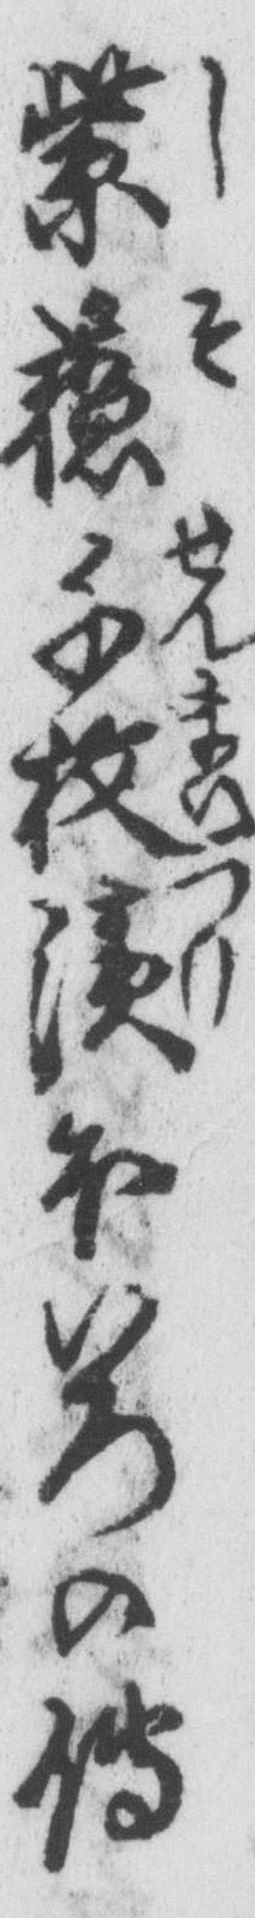紫蘇千枚漬ほいろの傳
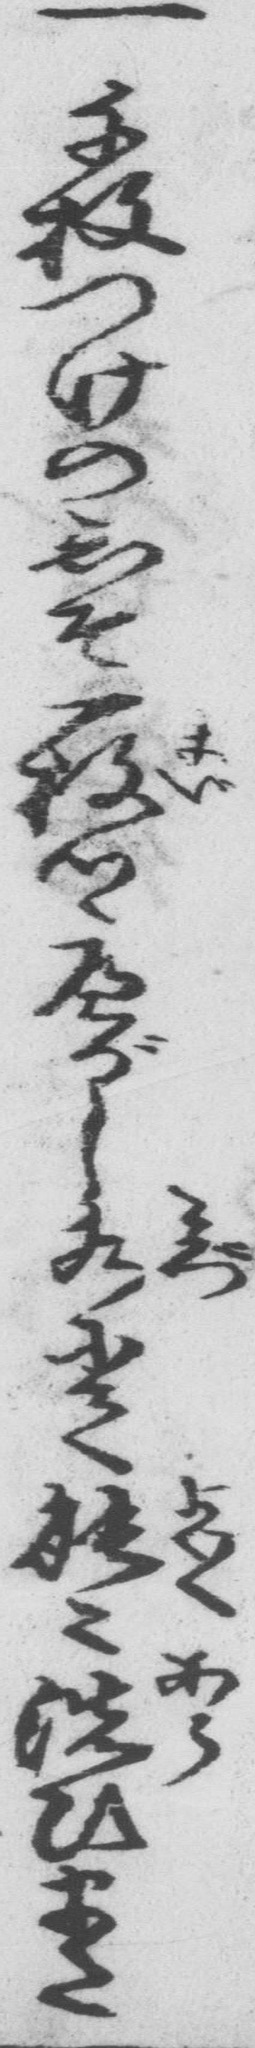一千枚つけのしそ一枚をへがし水にて能々洗ひまた
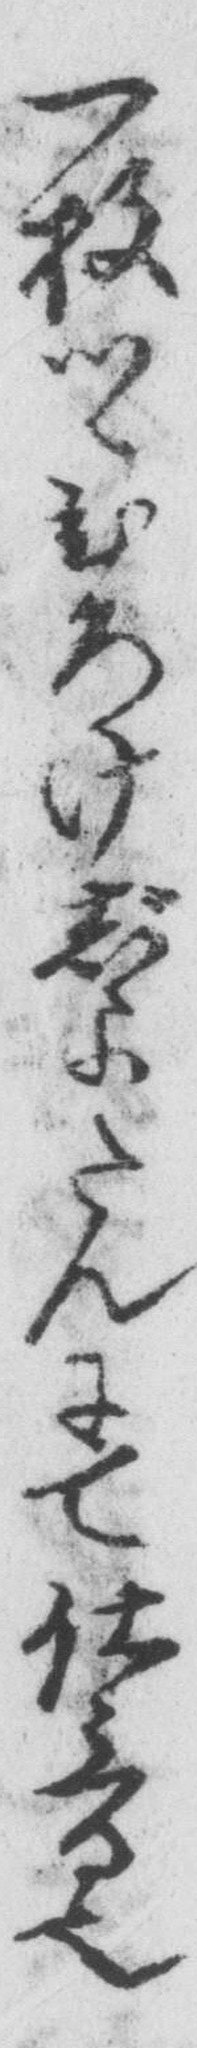一枚ツヽひろけじよたんにて仕立る也
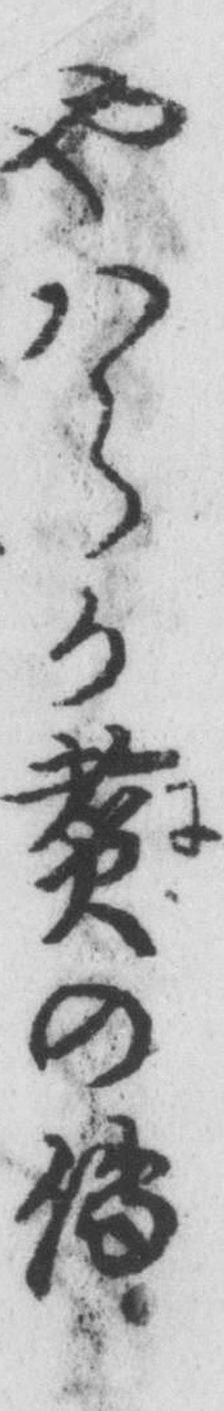やハらか煮の傳
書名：当世料理献立
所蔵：大阪府立大学学術情報センター 国文学研究資料館
